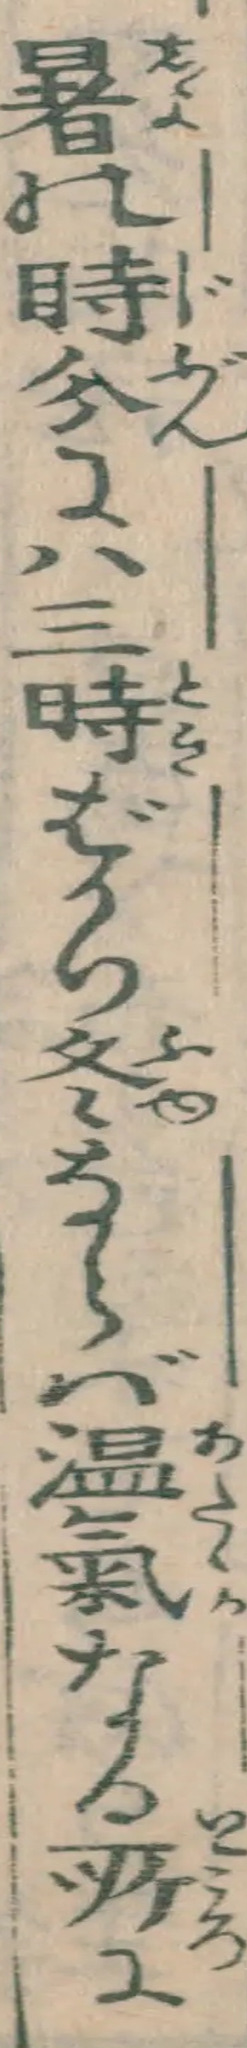暑の時分には三時ばかり冬ならば温気なる所に
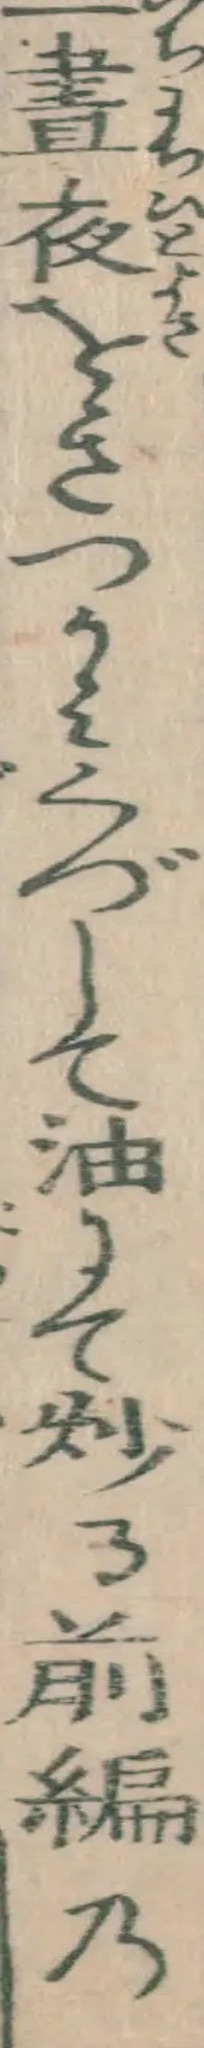一昼夜をきつかみくづして油にて炒る前編の
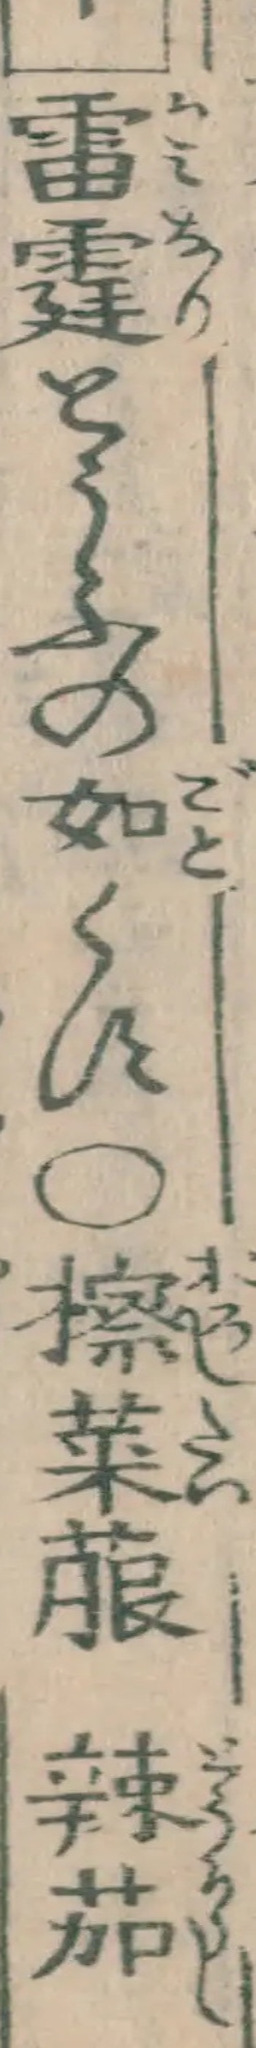十雷霆とうふの如くす○擦莱菔辣茄
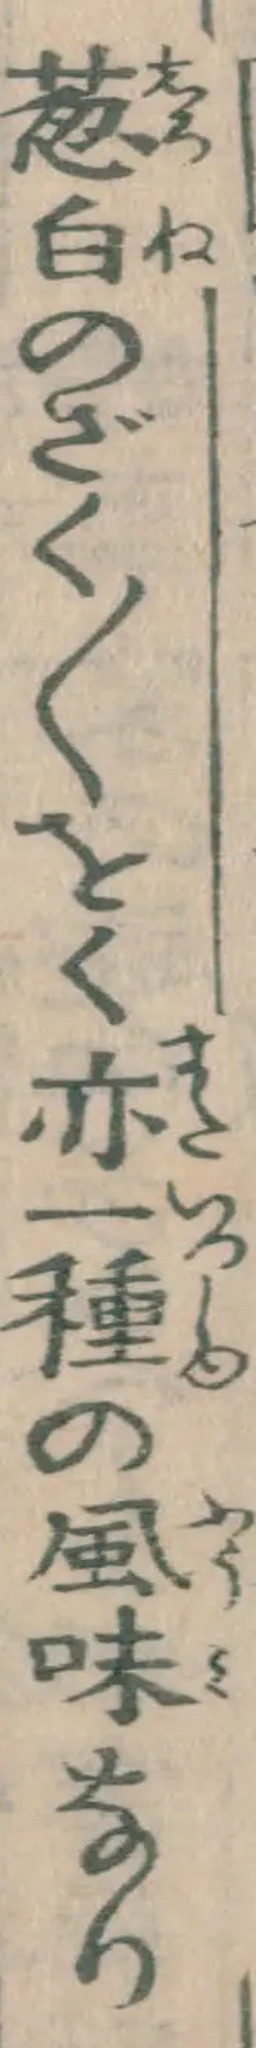葱白のざく〳〵をく亦一種の風味なり
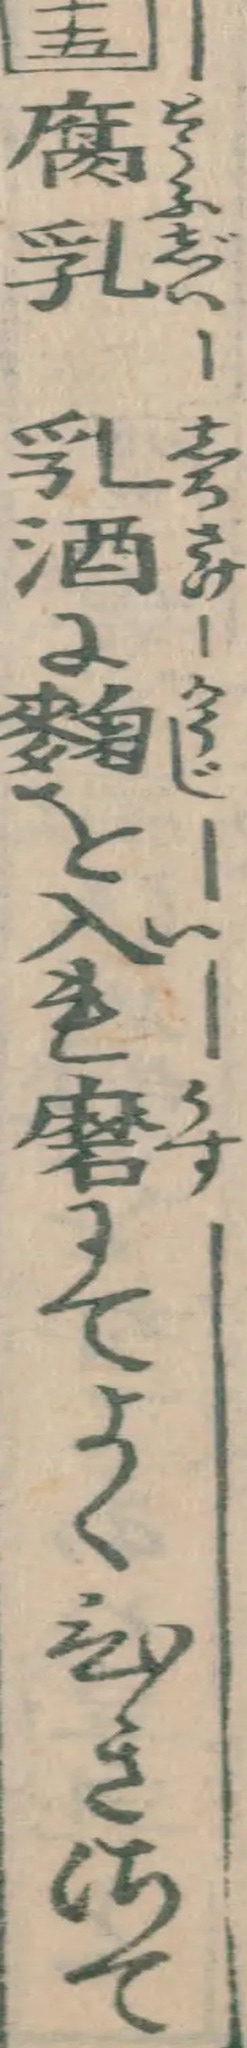六十五腐乳乳酒に麹を入れ磨にてよくひきさて
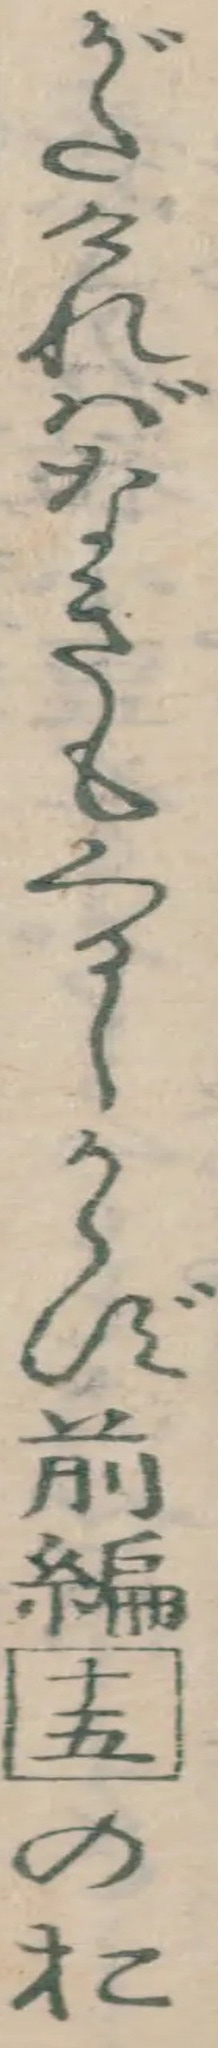がたければなきもくるしからず前編十五のお
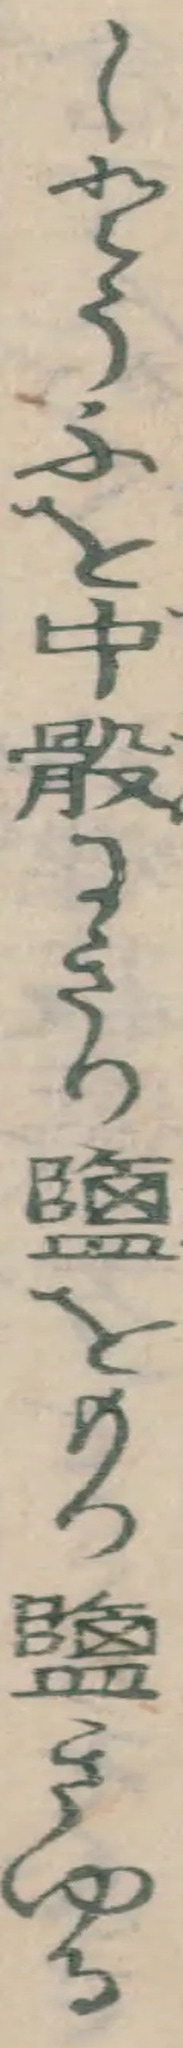しとうふを中骰にきり塩をもり塩きゆる
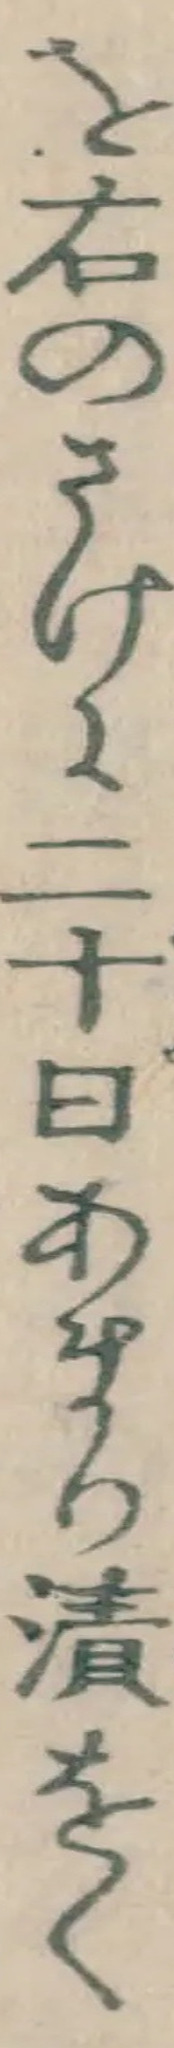を右のさけに二十日あまり漬をく
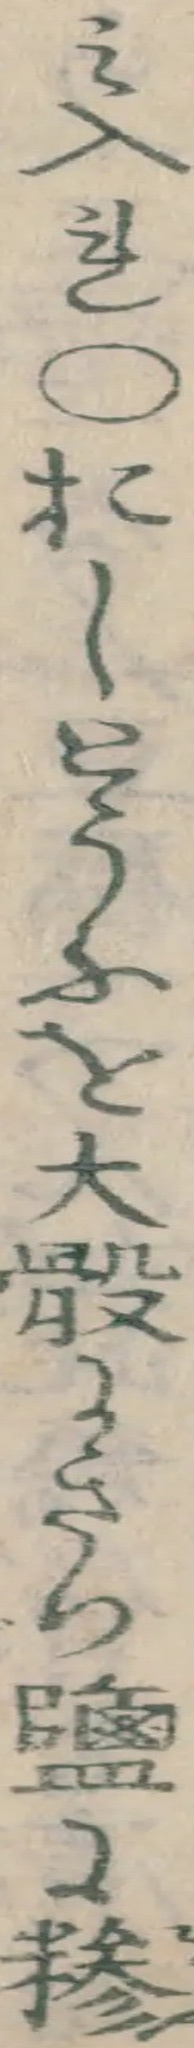み入れ○おしとうふを大骰にきり塩に糝
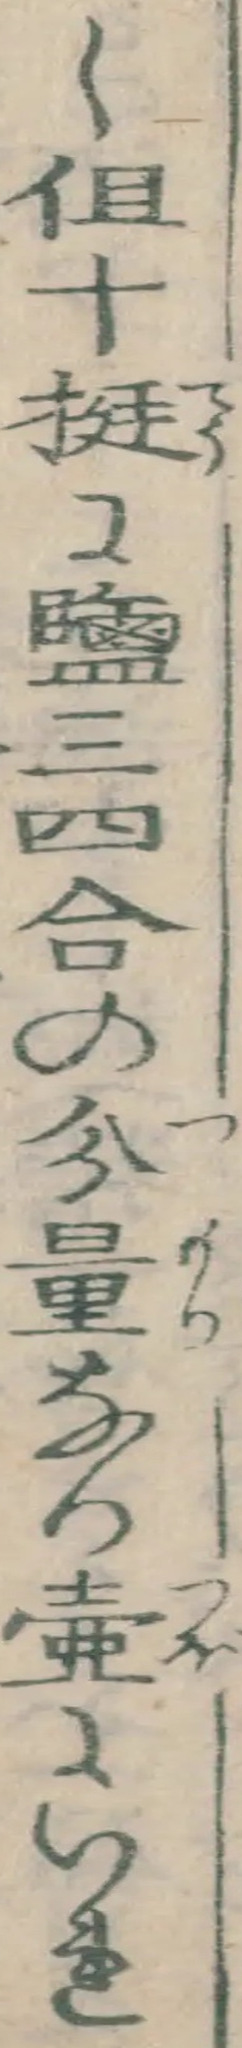し但十挺に塩三四合の分量なり壺にいれ
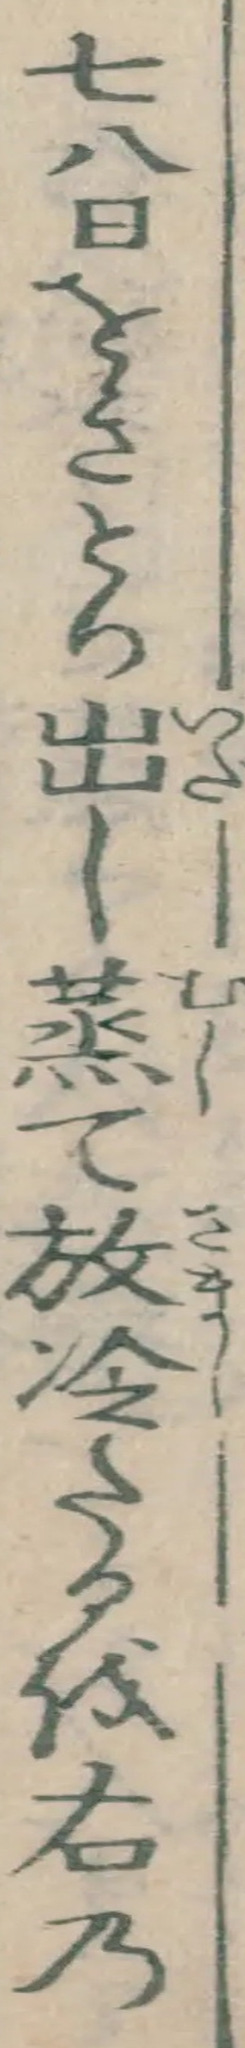七八日をきとり出し蒸て放冷たるを右の
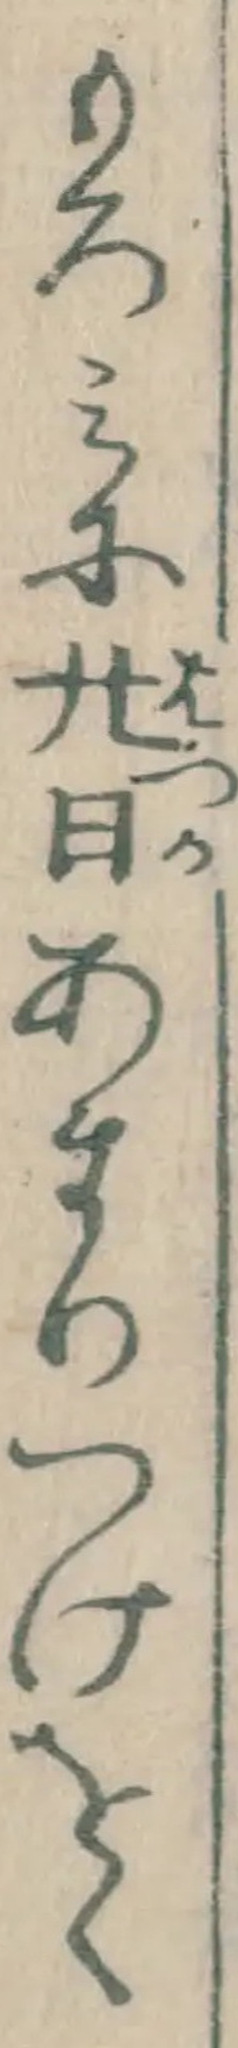もろみに廿日あまりつけをく

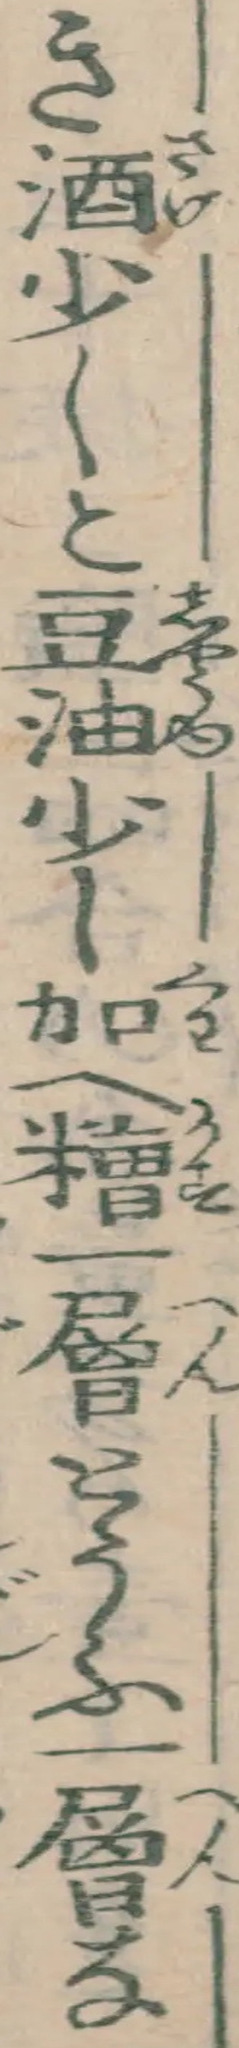き酒少しと豆油少し加へ糟一層とうふ一層な
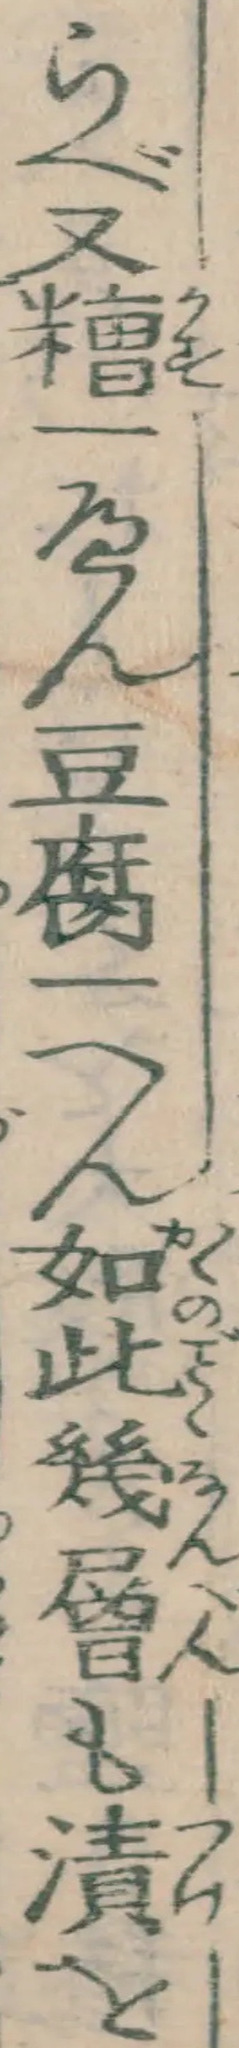らべ又糟一へん豆腐一へん如此幾層も漬を
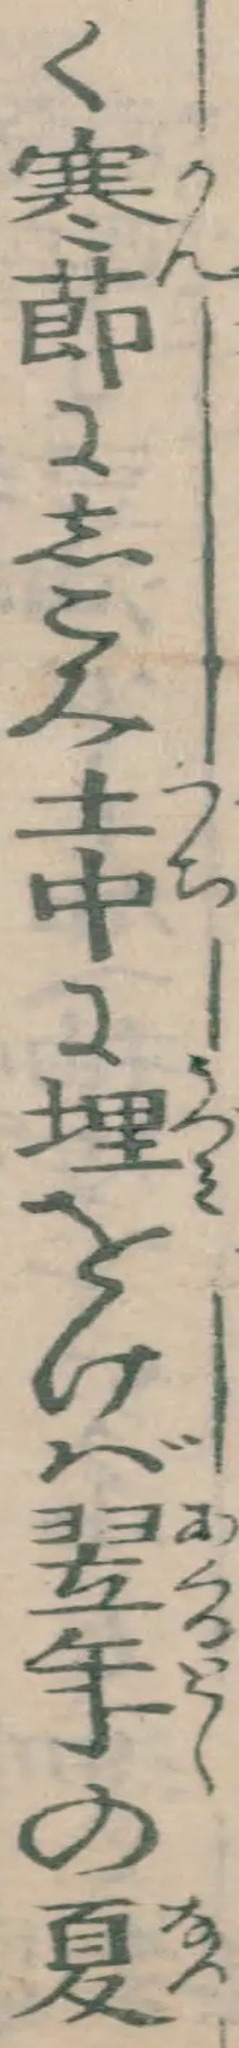く寒節にしこみ土中に埋をけば翌年の夏
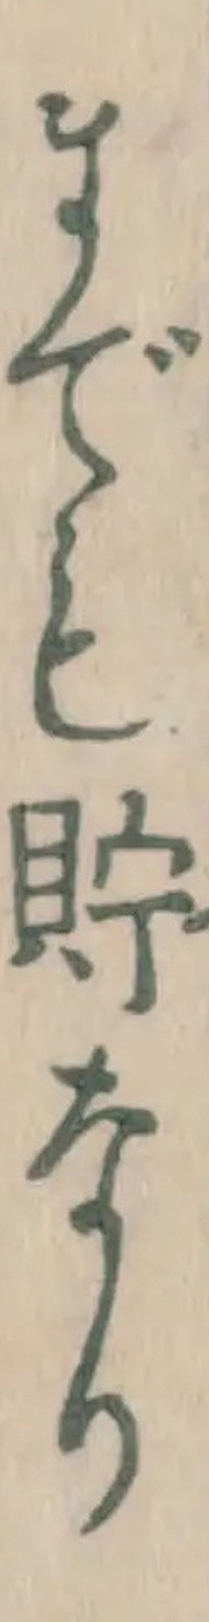までも貯なり
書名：豆腐百珍. 続編
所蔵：国立国会図書館 National Diet Library, JAPAN
